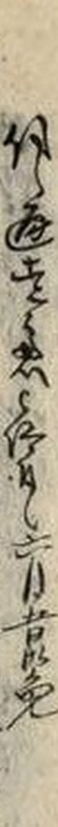伺之通遠慮被仰付候六月五日御免
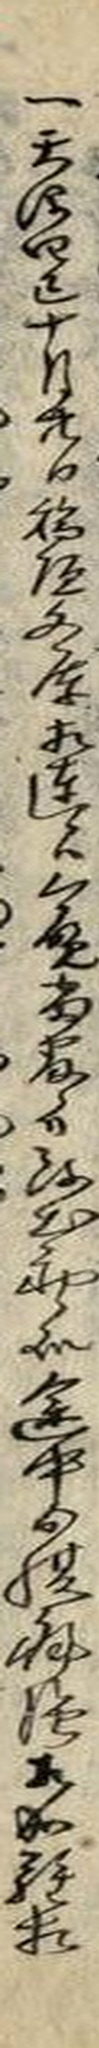一天保四巳十月廿日稲垣文庫相達候は今晩当番に付致出勤候処途中ゟ腹痛強相成難相
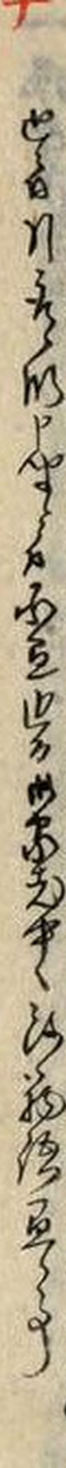廻に付引取候段申聞候に付承置追て御家老中へ致御物語置候事

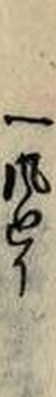一風廻り
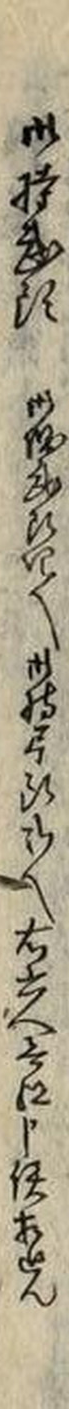御持武頭御側武頭四人御持弓頭弐人右六人壱組申談相廻ル
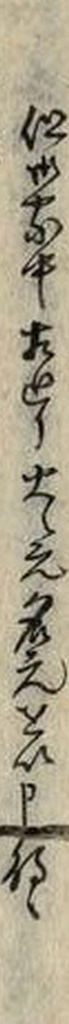但御家中相廻り火之元名元を以申触候
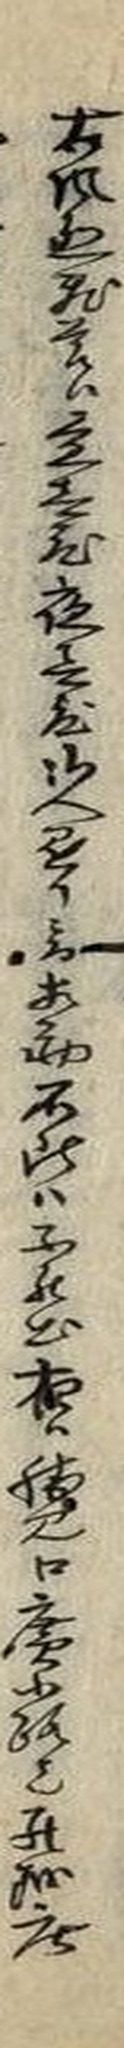右風烈敷節は昼壱度夜壱度弐人懸りにて相勤不断は不罷出夜は勝見口広小路迄罷越庄
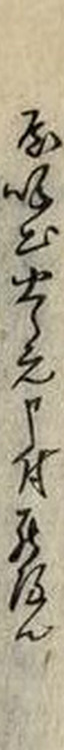屋呼出火之元申付罷帰ル
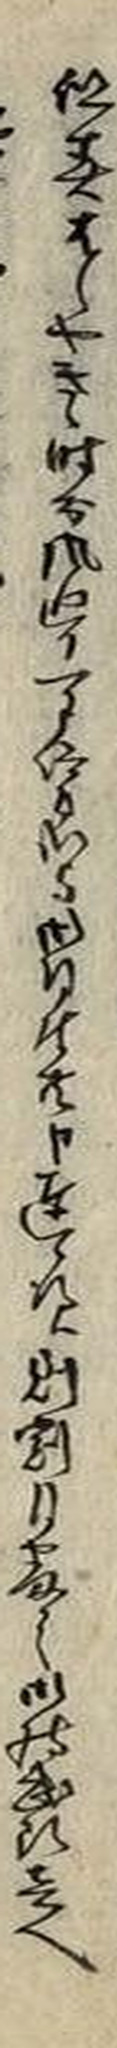但春はしやき候時分風廻り可被仰付哉と御目付共申達候得は則割月番之御持武頭壱人
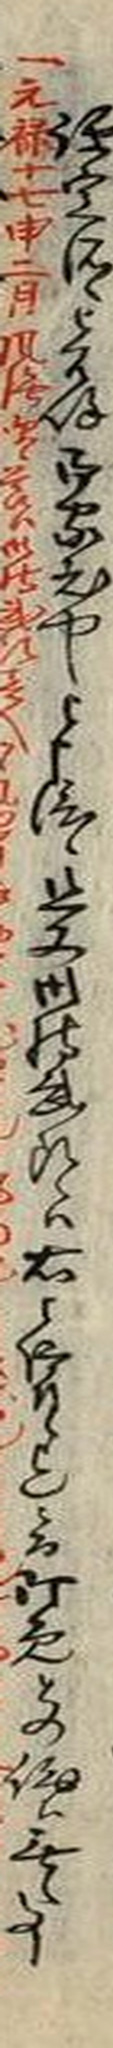評定所へ被召呼御家老中被申渡候且又御持武頭へは右被仰付候迄にて御免との儀は無之事
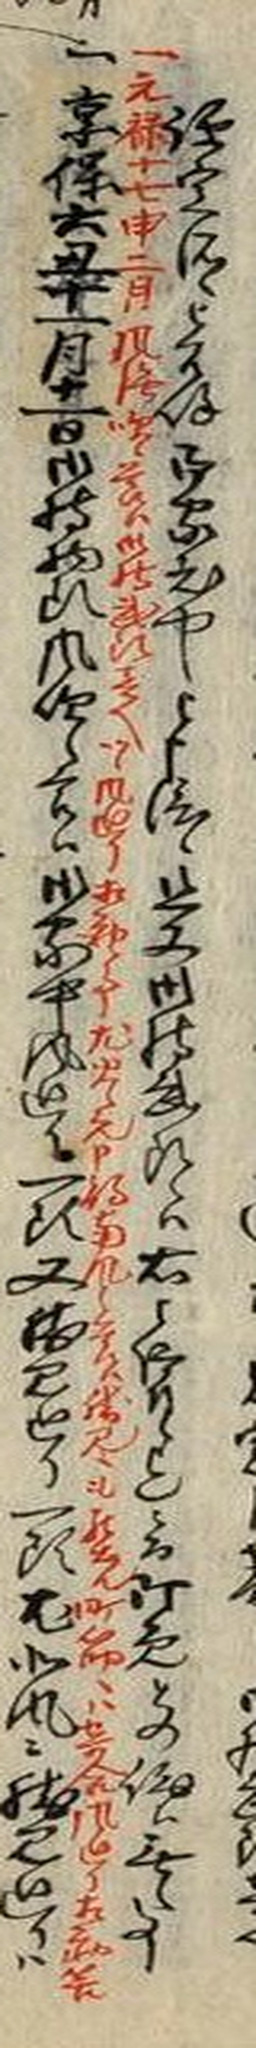一享保六丑十一月十一日御持物頭風吹候節は御家中風廻り一頭又勝見廻り一頭尤北風に勝見廻りは
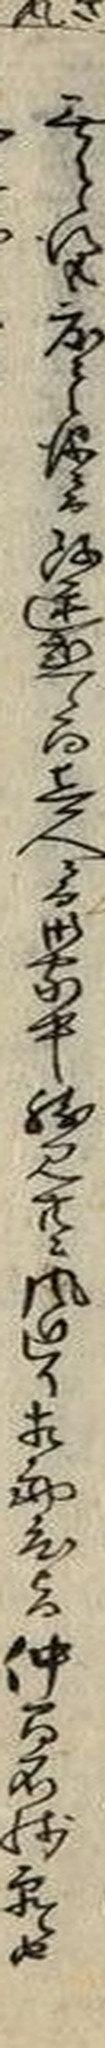無之候得共度々之儀にて致迷惑候間壱人にて御家中勝見共に風廻り相勤度旨仲間不残願候由
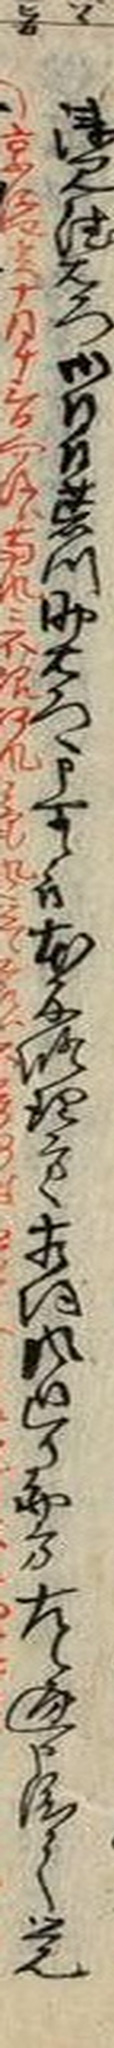浅見徳右衛門御目付荒川助右衛門へ申聞候に付本多修理方へ相伺風廻り勤方左之通申渡之覚
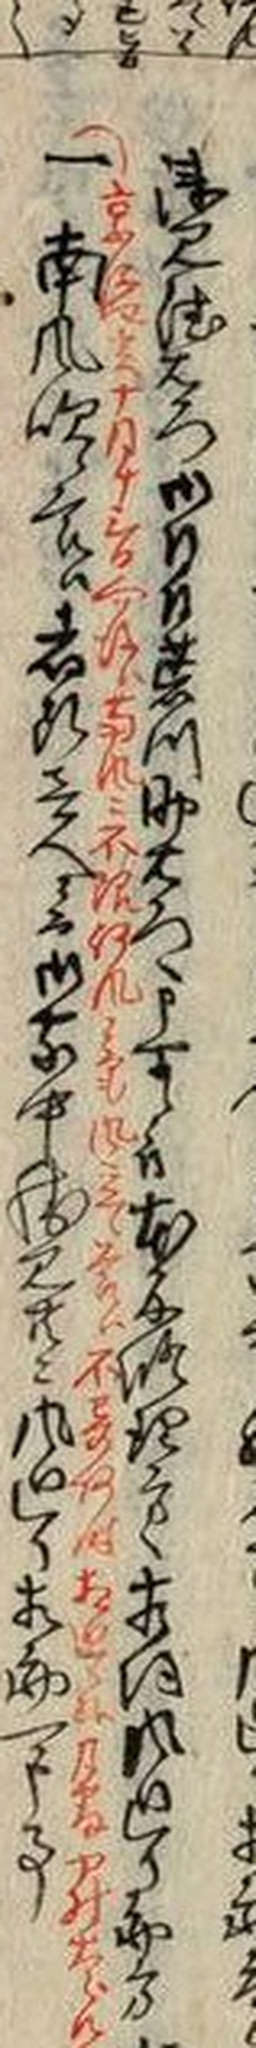一南風吹候節は者頭壱人にて御家中勝見共に風廻り相勤可申事
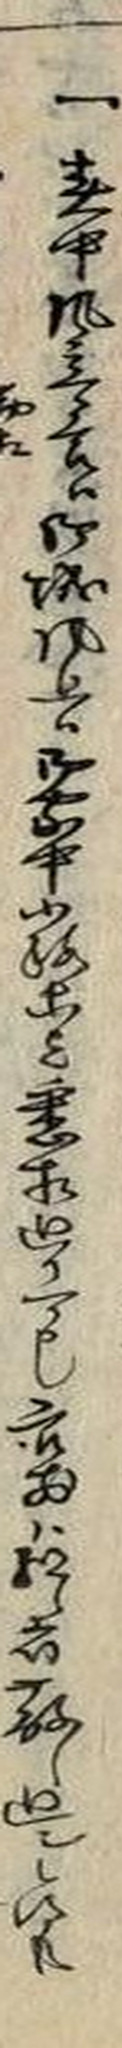一春中風立候節は御城風上は御家中小路等迄悉相廻り可申候最前は組之者散し廻シ候得共
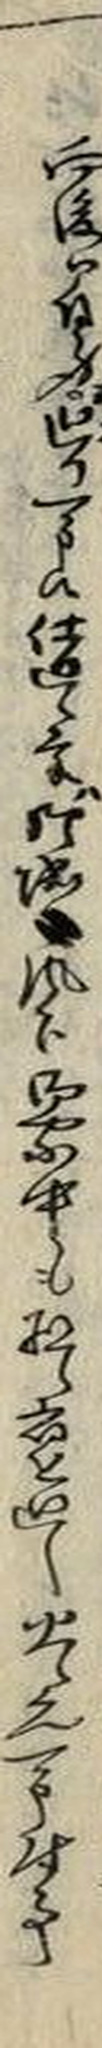向後は自身◦勤相廻り可申候仕廻候節は御城風下御家中へも組之者を廻し火之元可申付事
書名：御城下諸事之部
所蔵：福井県文書館 Fukui Prefectural Archives
